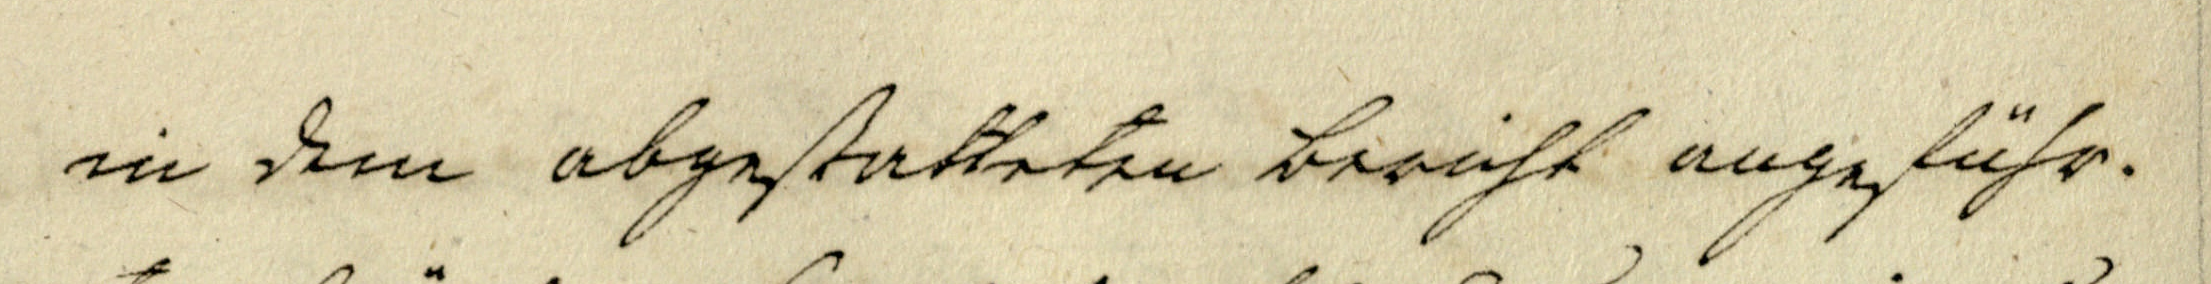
in dem abgestatteten Bericht angeführ¬
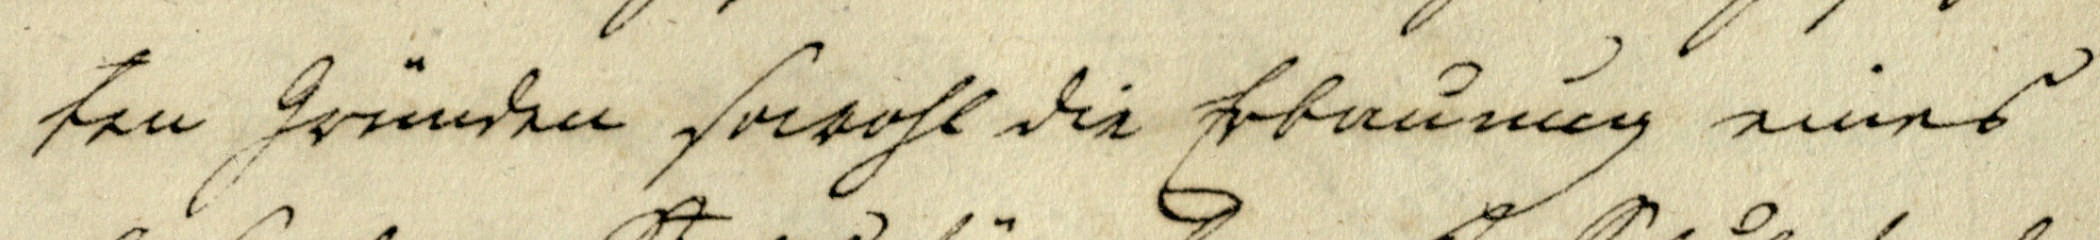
ten Gründen sowohl die Erbauung eines
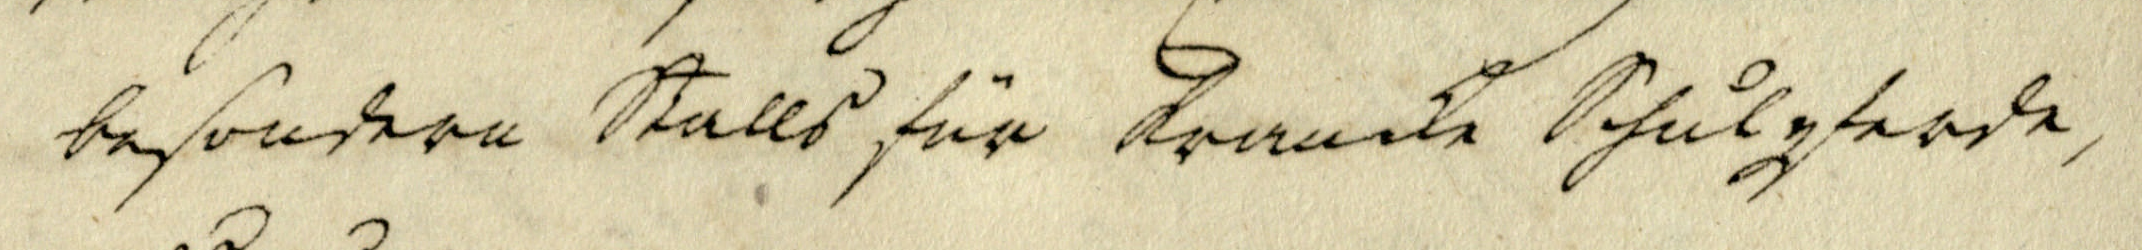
besondern Stalls für krancke Schulpferde,
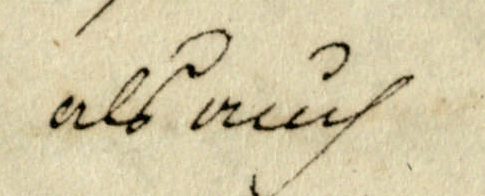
als auch
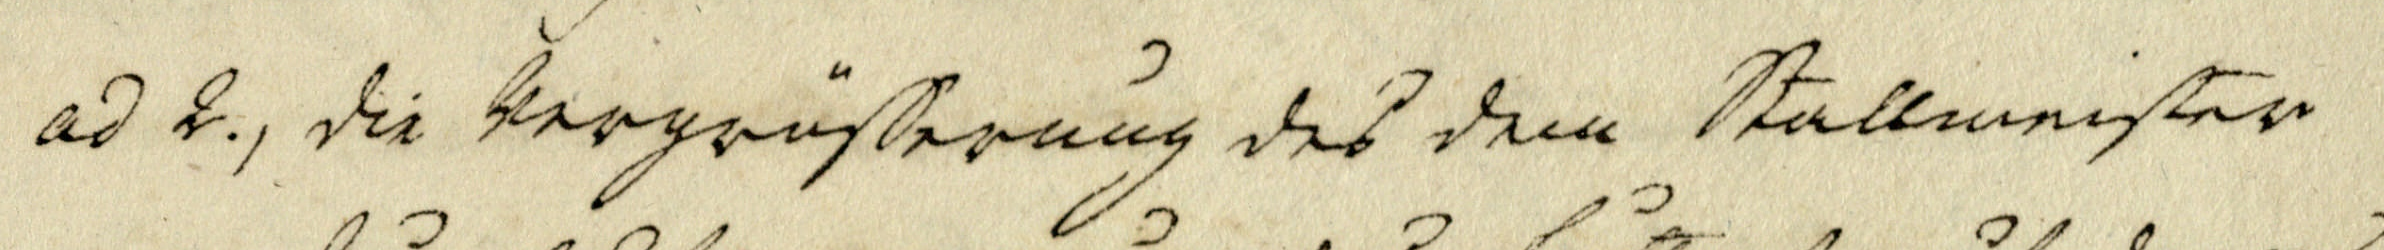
ad 2., die Vergrösserung des dem Stallmeister
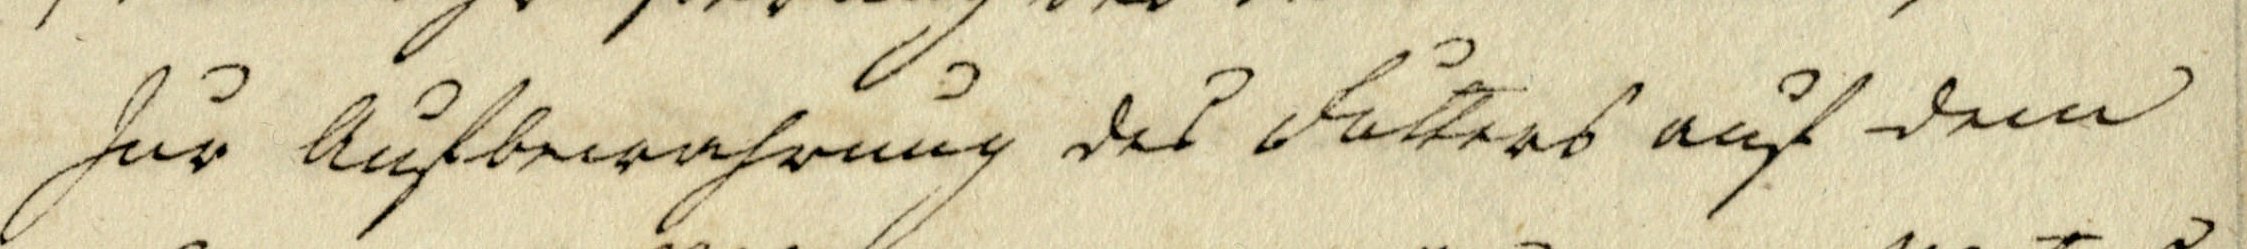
zur Aufbewahrung des Futters auf dem
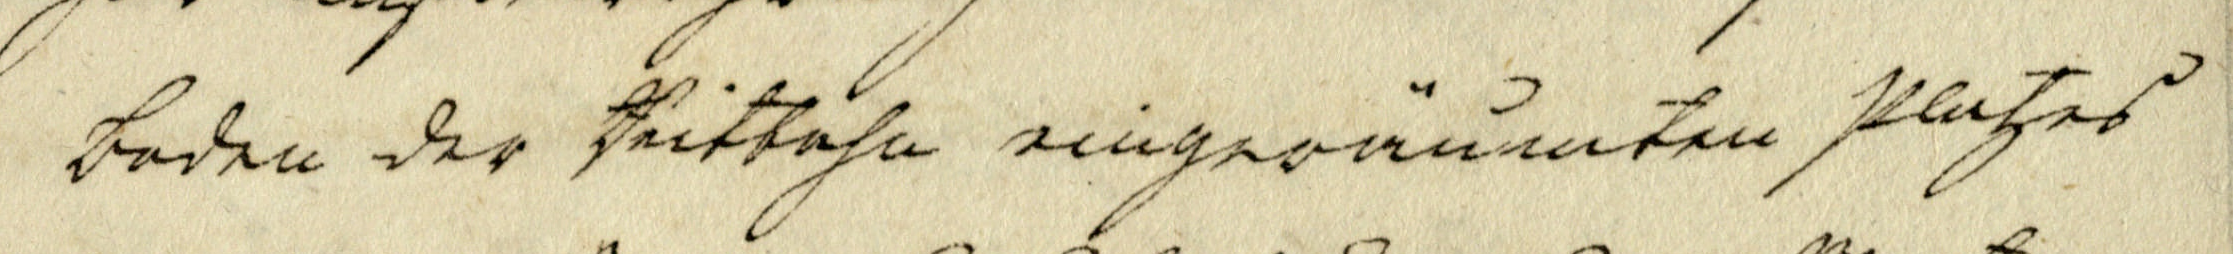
Boden der Reitbahn eingeräumten Platzes
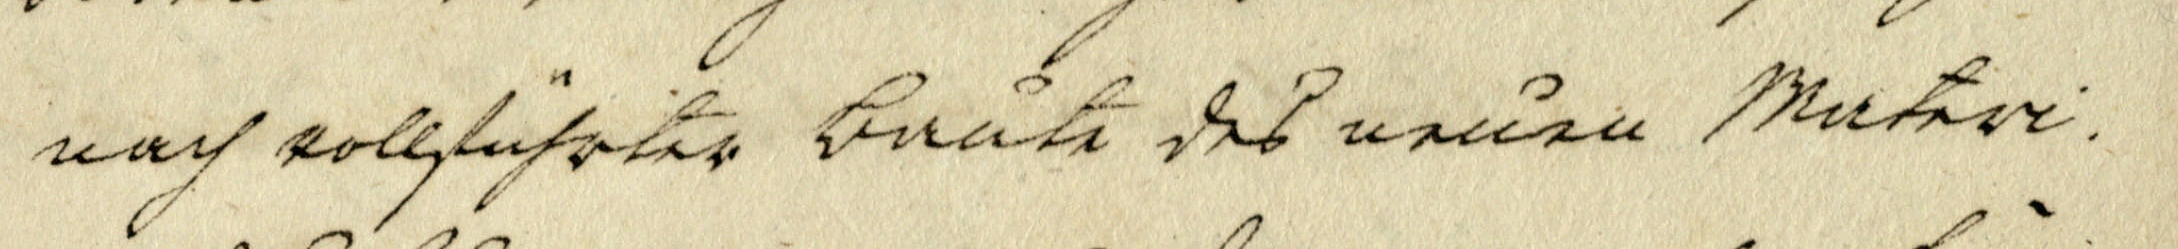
nach vollführter Baute des neuen Materi¬
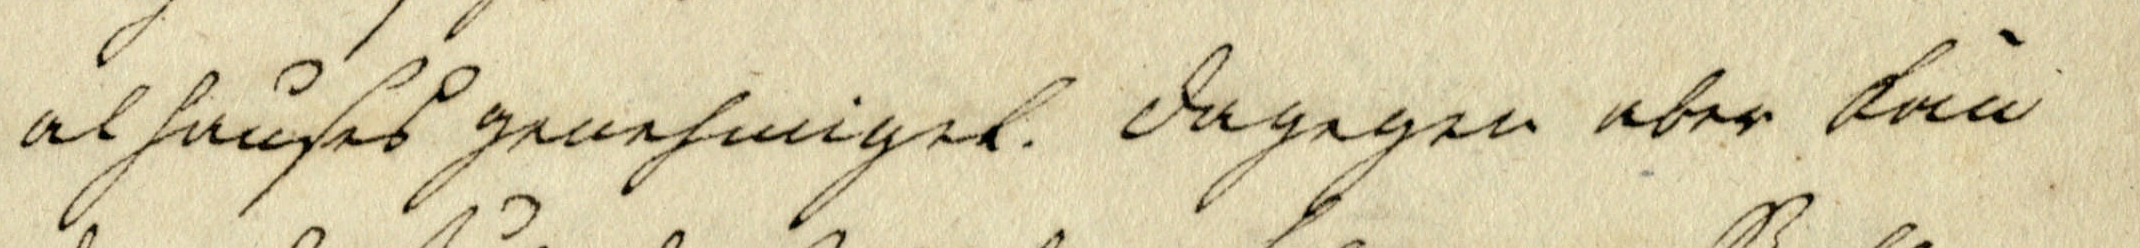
alhauses genehmiget. Dagegen aber kan
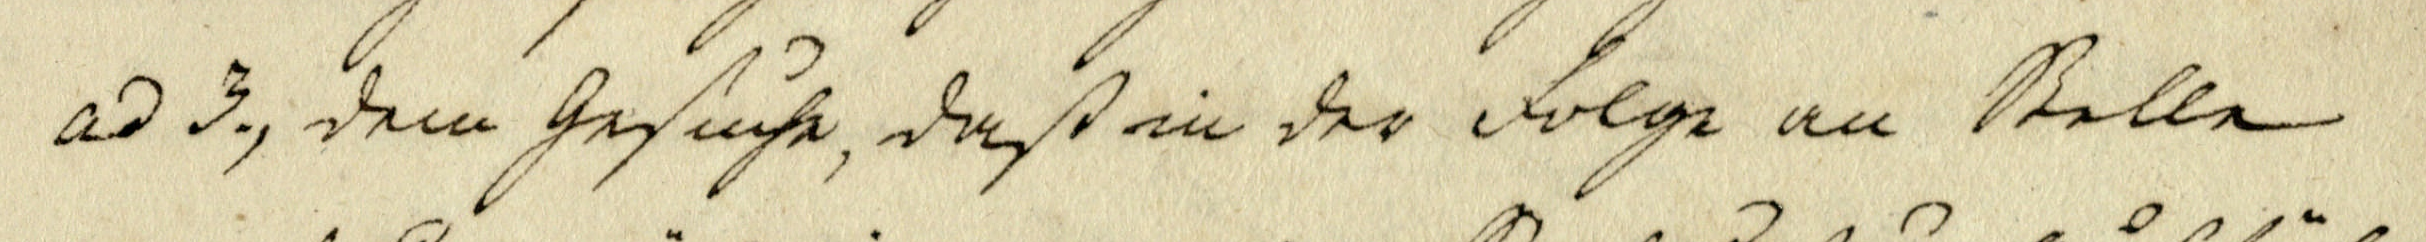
ad 3., dem Gesuche, daß in der Folge an Stelle
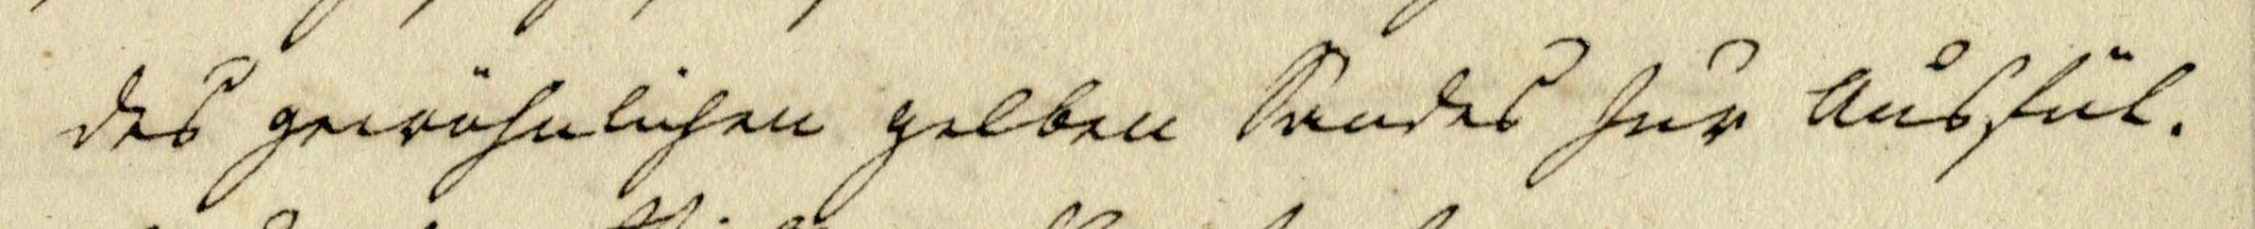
des gewöhnlichen gelben Sandes zur Ausfül¬
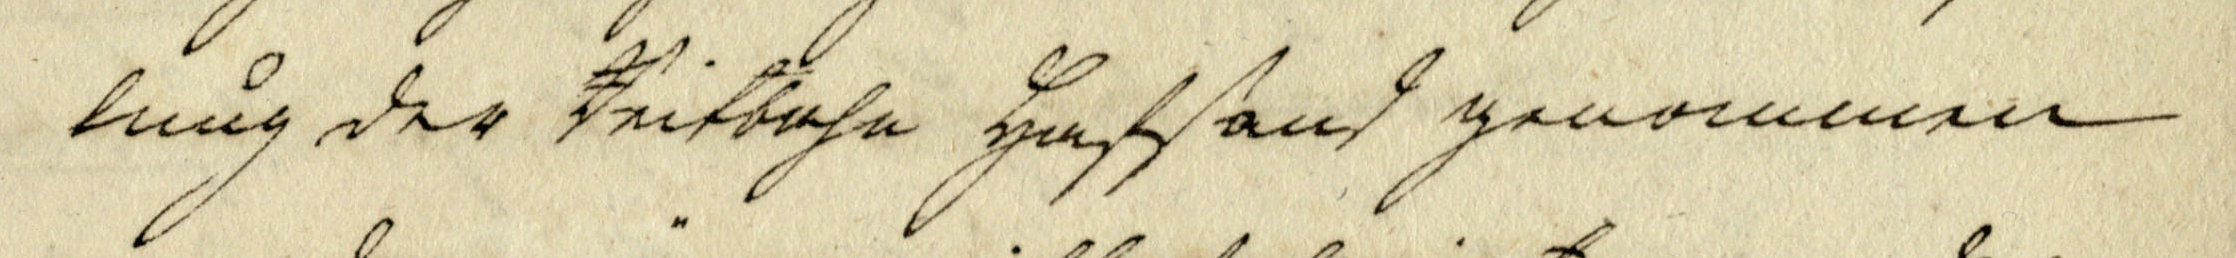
lung der Reitbahn Hafsand genommen
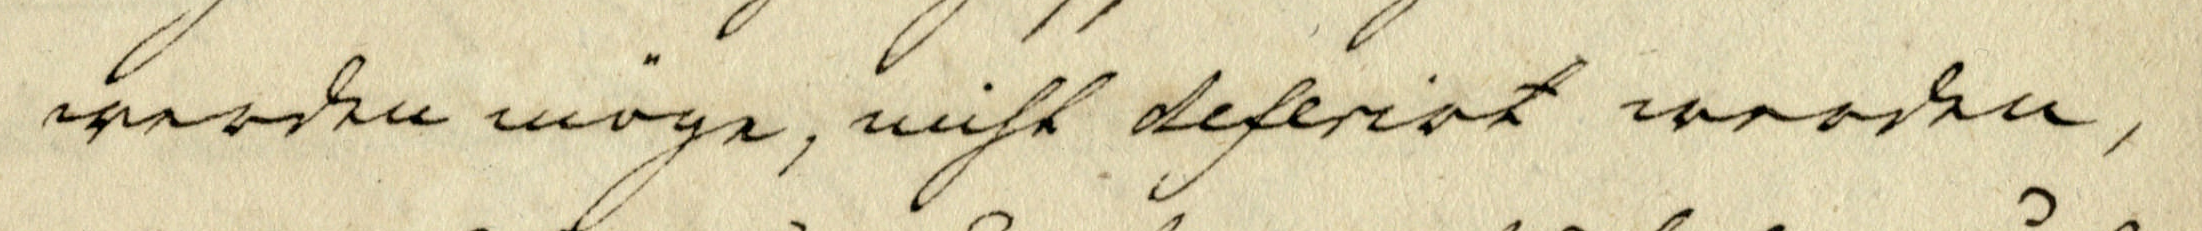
werden möge, nicht deferirt werden,
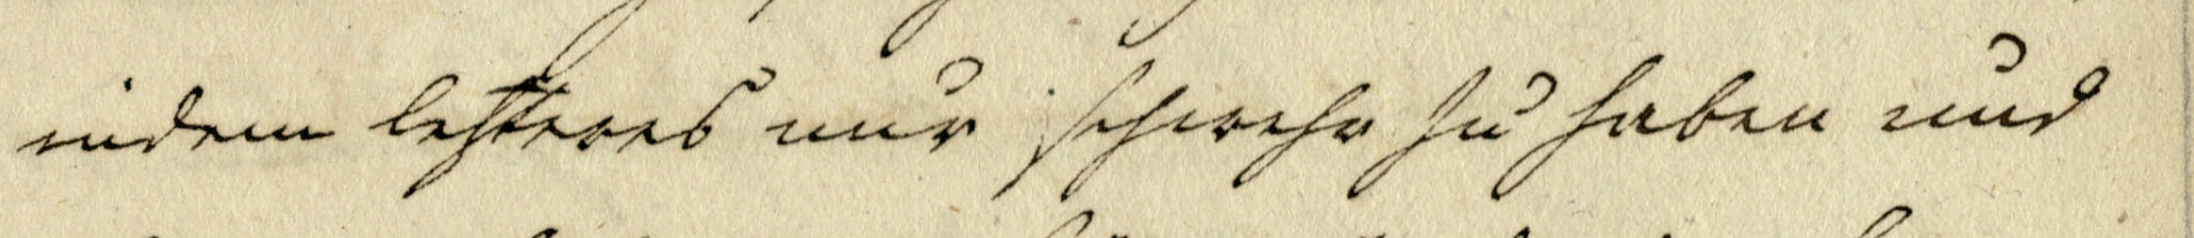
indem letzteres nur schwehr zu haben und
